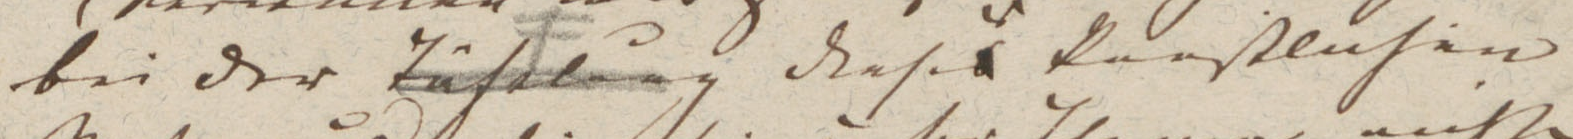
bei der Täfelung % diesesr künstlichen
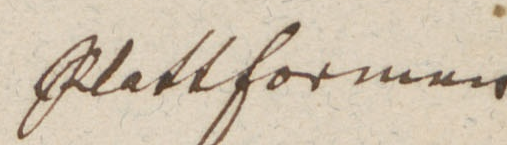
Plattformen
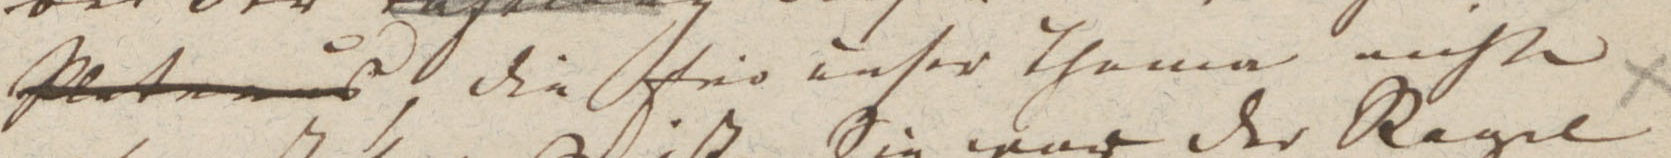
Plateaus, die für unser Thema nicht
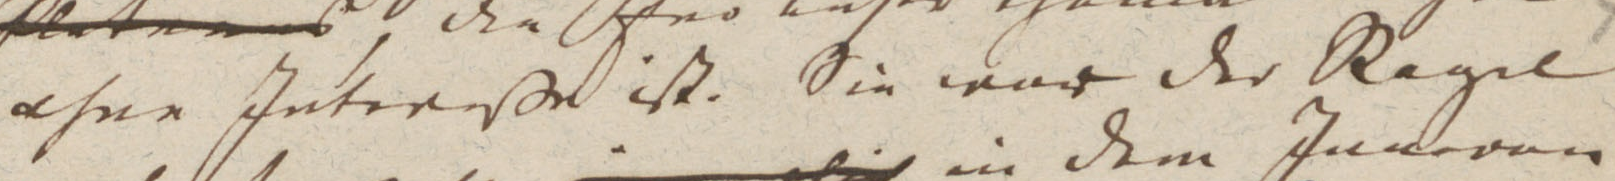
ohne Interesse ist. Sie war der Regel %
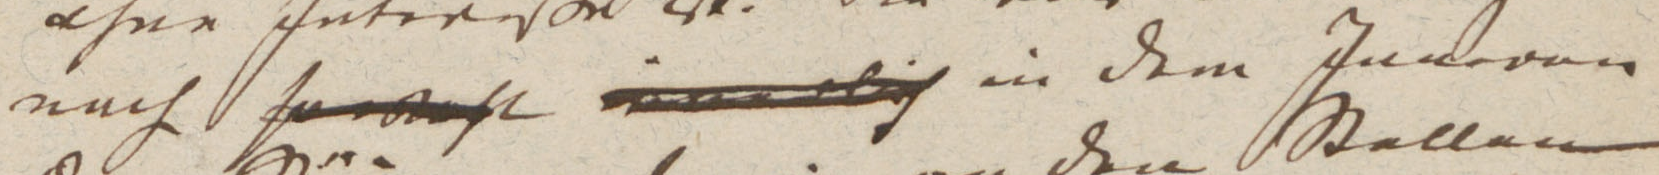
nach sowohl innerlich in dem Inneren
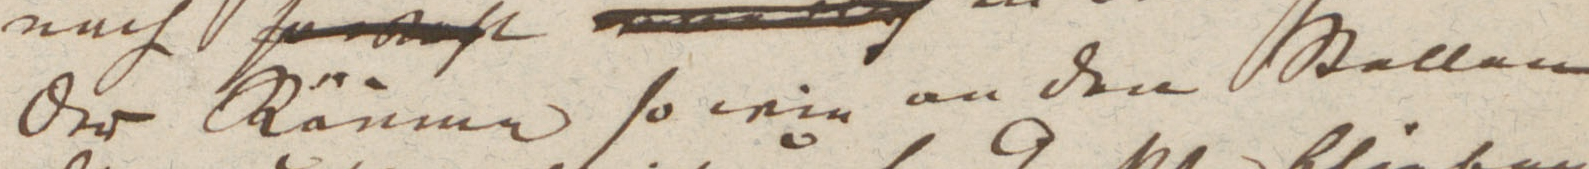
der Räume so wie an den Stellen
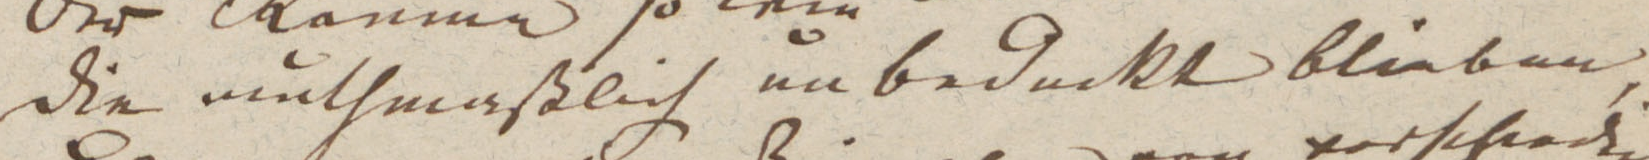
die muthmasslich unbedeckt blieben,
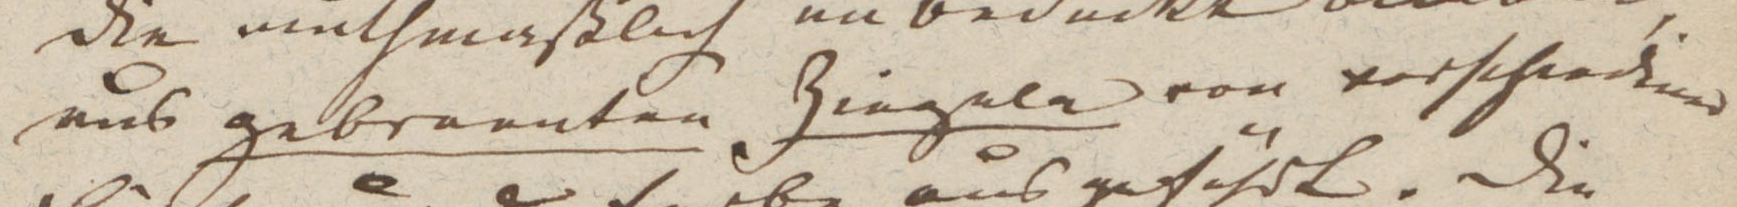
aus gebrannten Ziegeln von verschiedener
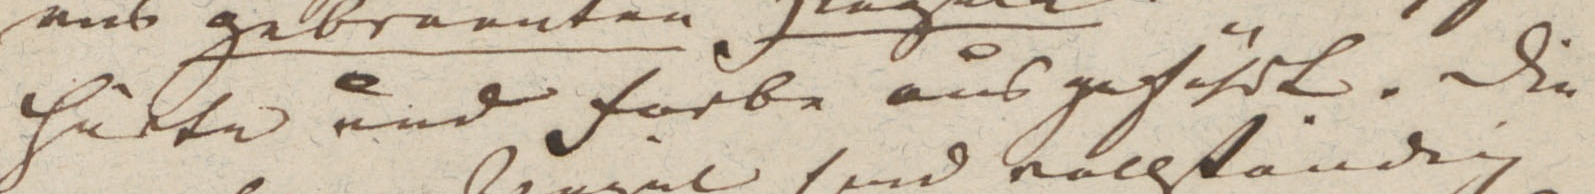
Härte und Farbe ausgeführt. Die
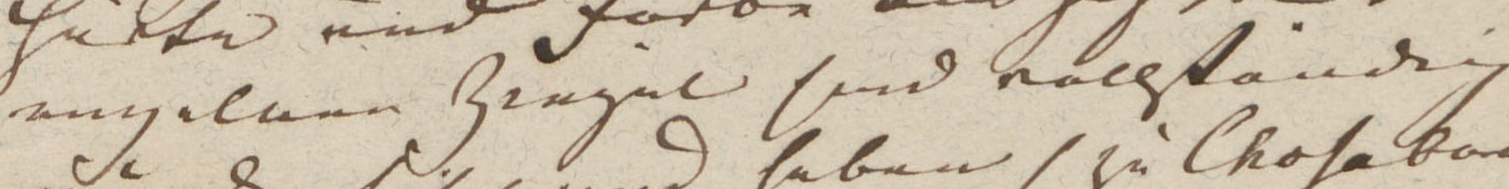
einzelnen Ziegel sind vollständig
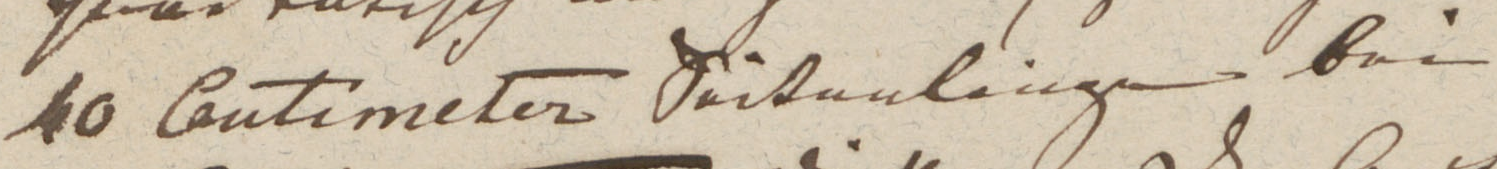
40 Centimeter Seitenlänge bei
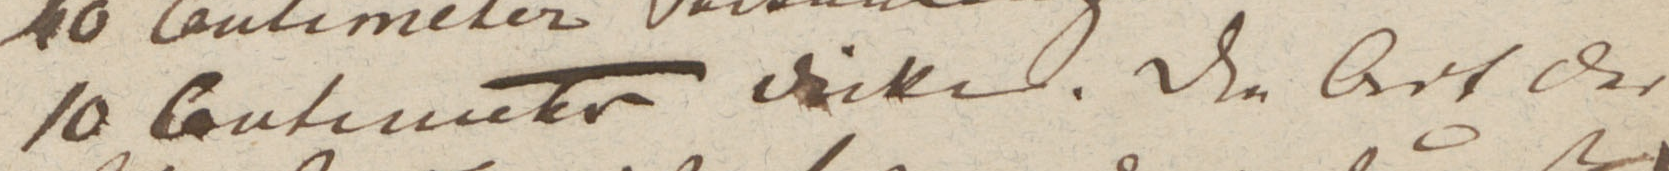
10 Centimeter Dicke. Die Art der
